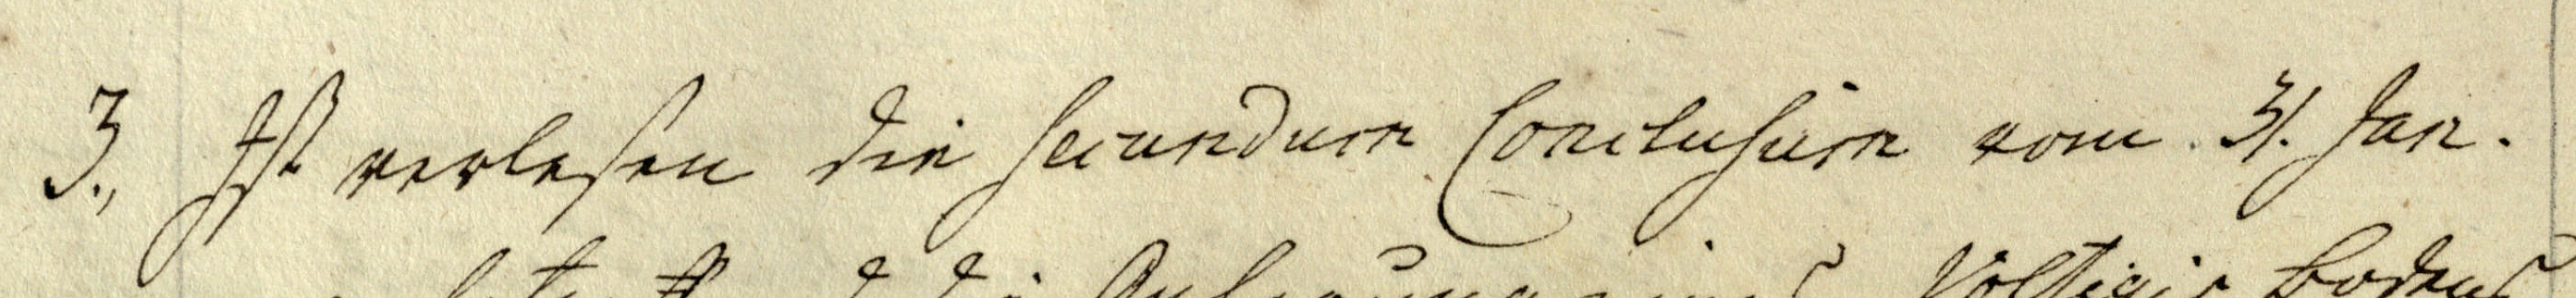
3., Ist verlesen die secundum Conclusum vom 31. Jan.
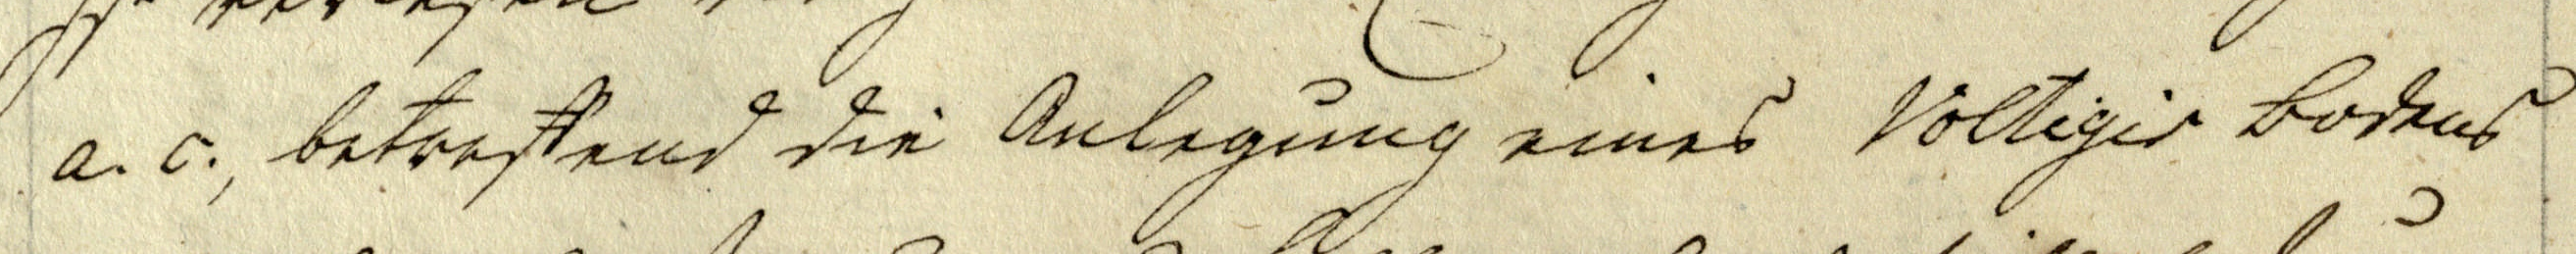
a. c. betreffend die Anlegung eines Voltigir Bodens
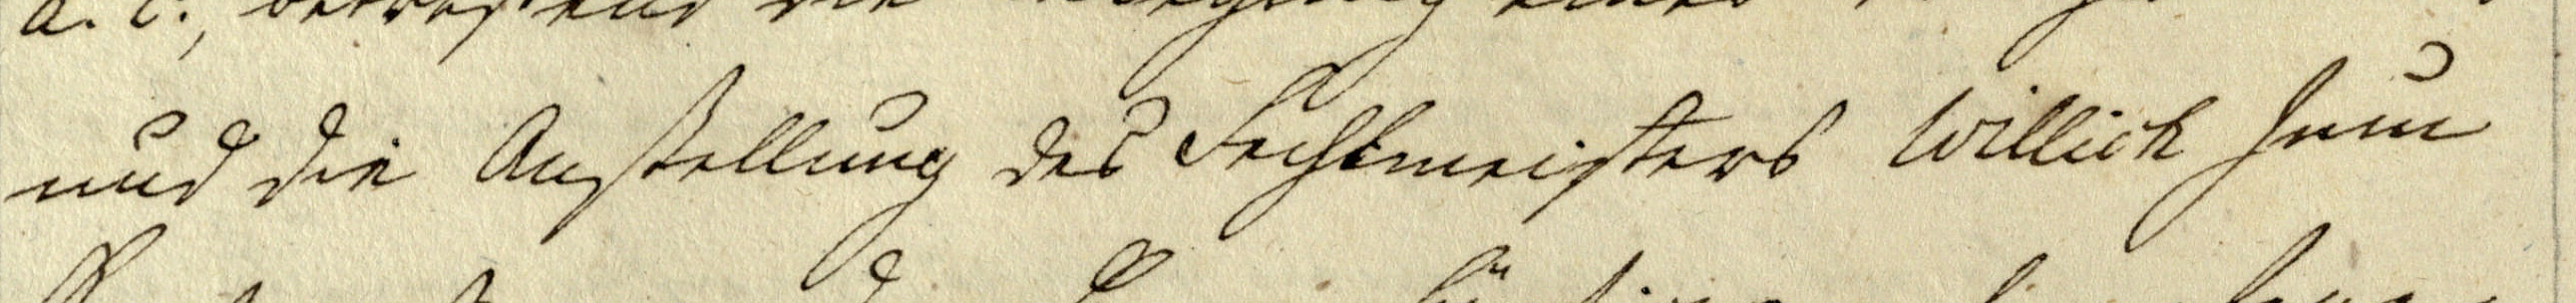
und die Anstellung des Fechtmeisters Willich zum
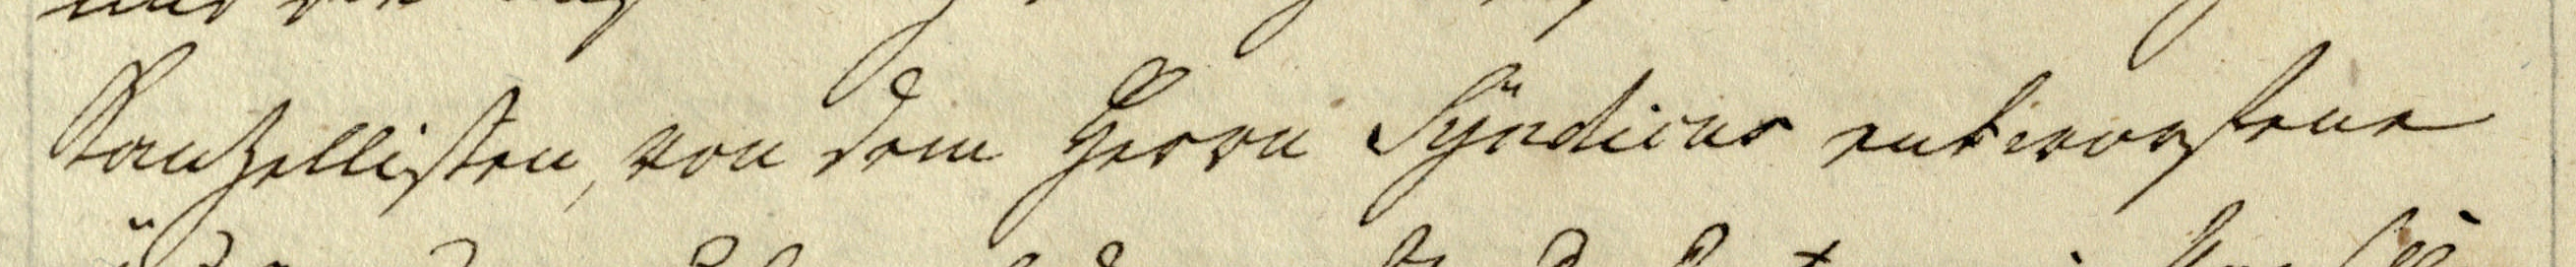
Kanzellisten von dem Herrn Sÿndicus entworfene
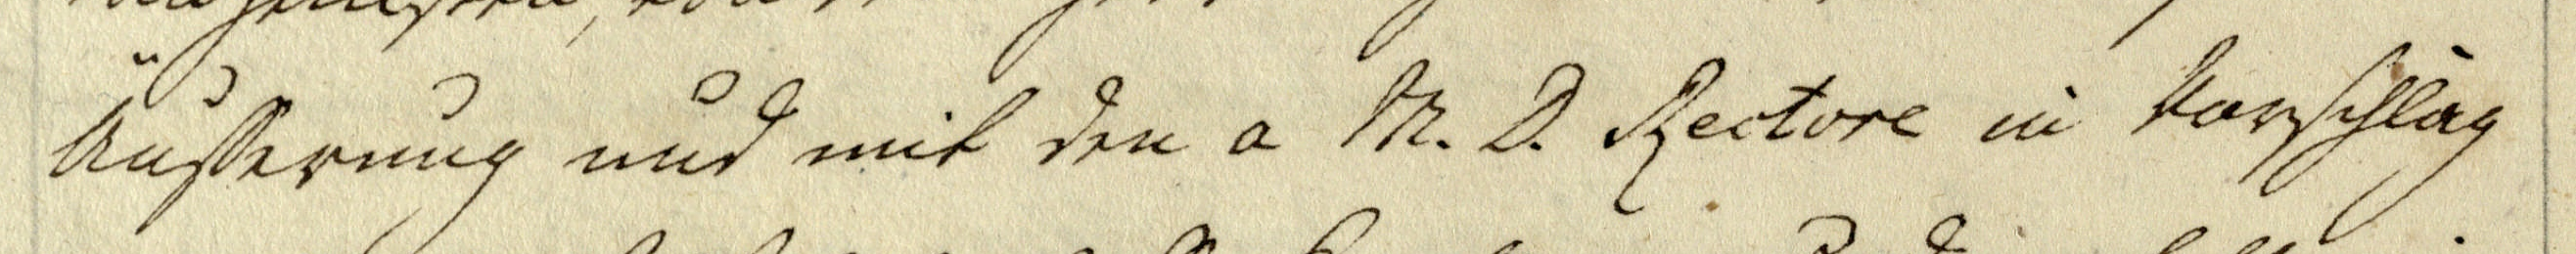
Äusserung und mit den a M. D. Rectore in Vorschlag
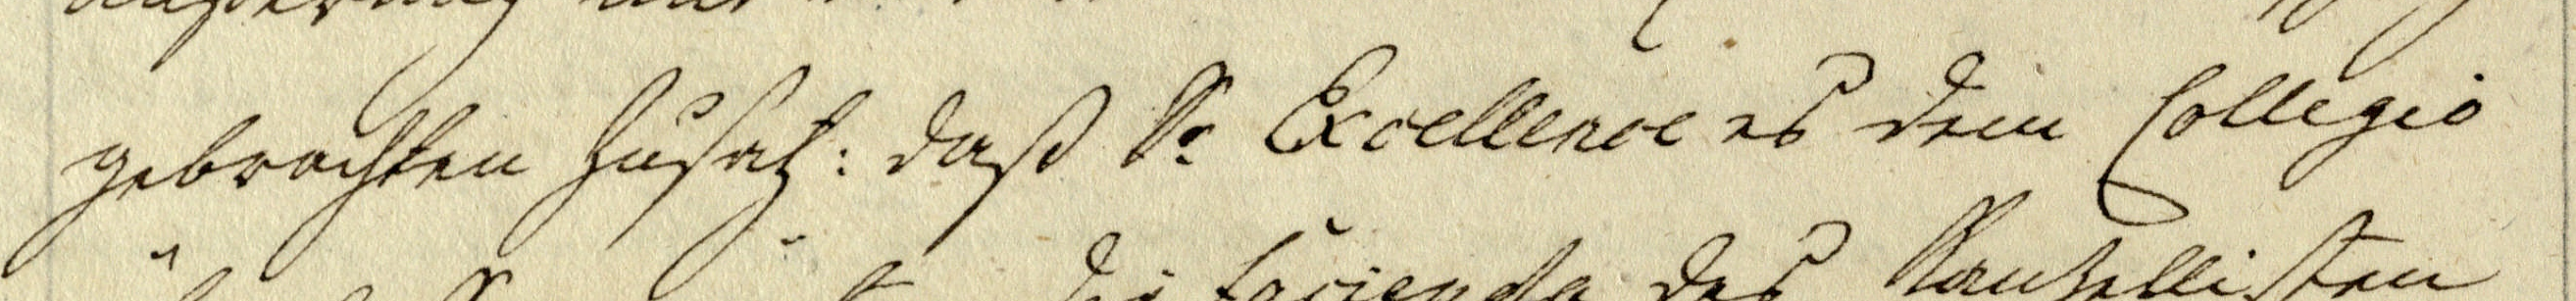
gebrachten Zusatz: daß Sr Excellence es dem Collegio
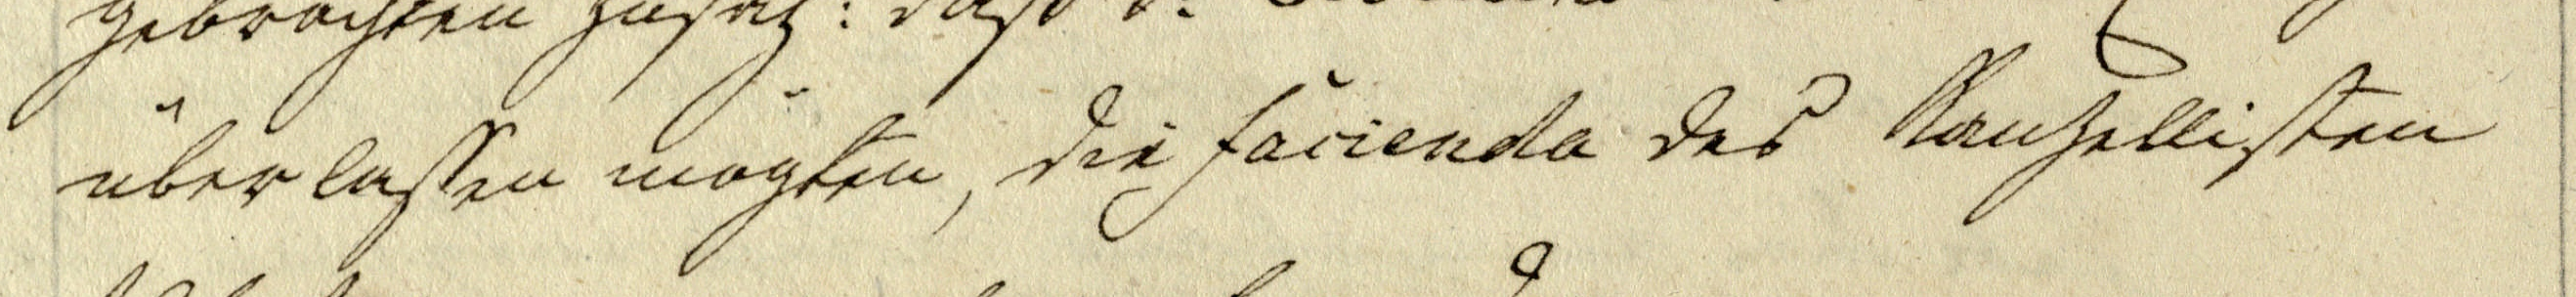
überlassen mögten, die Facienda des Kanzellisten
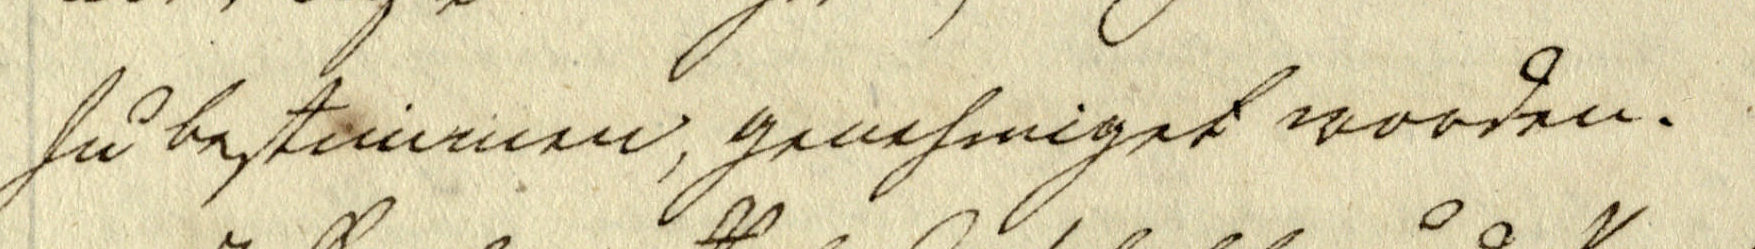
zu bestimmen, genehmiget worden.
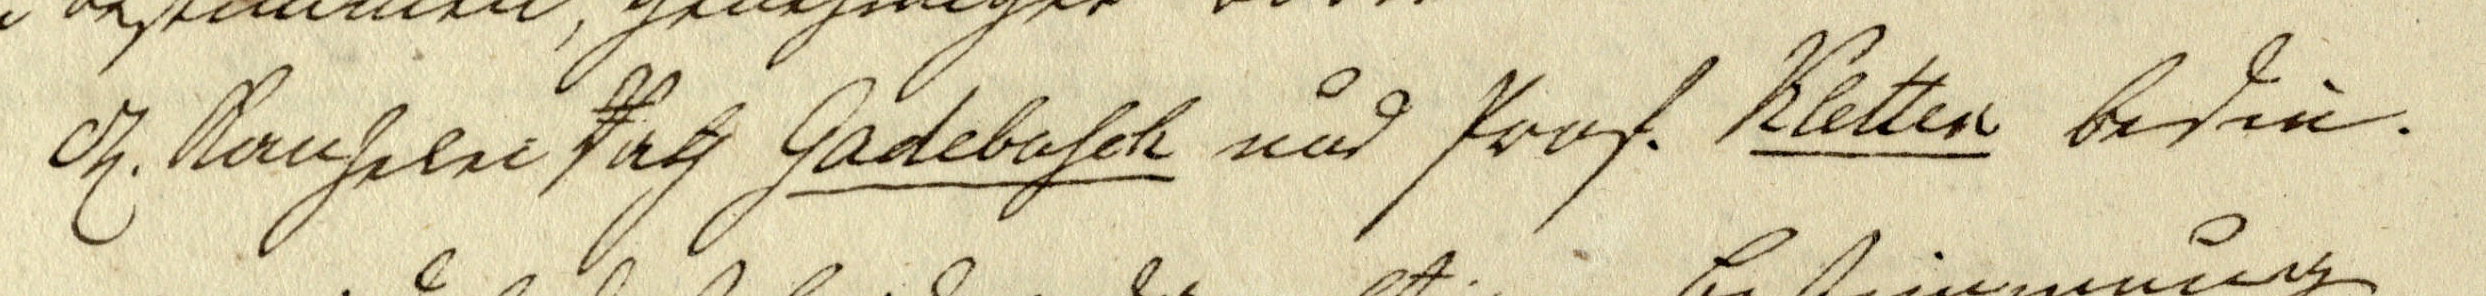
dh. Kanzelei Rath Gadebusch und Prof. Kletten bedin¬
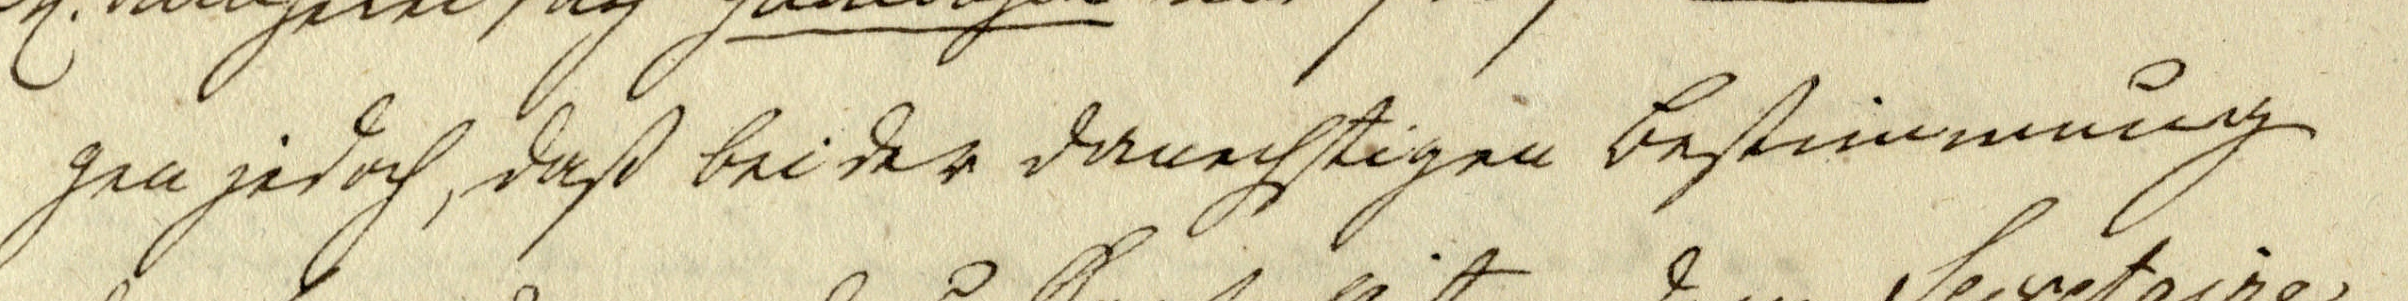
gen jedoch, daß bei der danechstigen Bestimmung
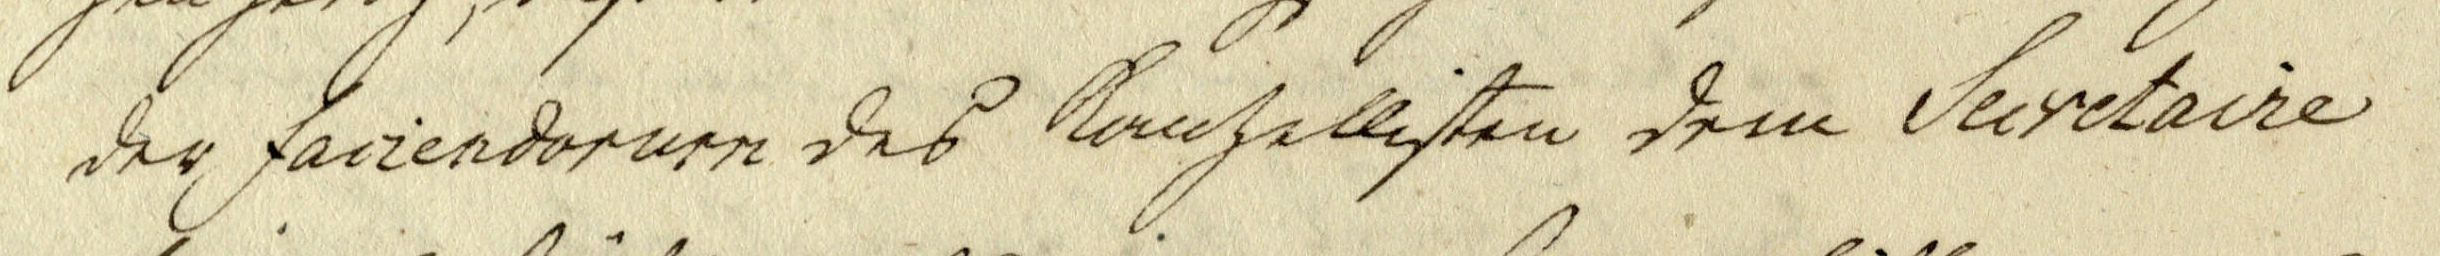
der Faciendorum des Kanzellisten dem Secretaire
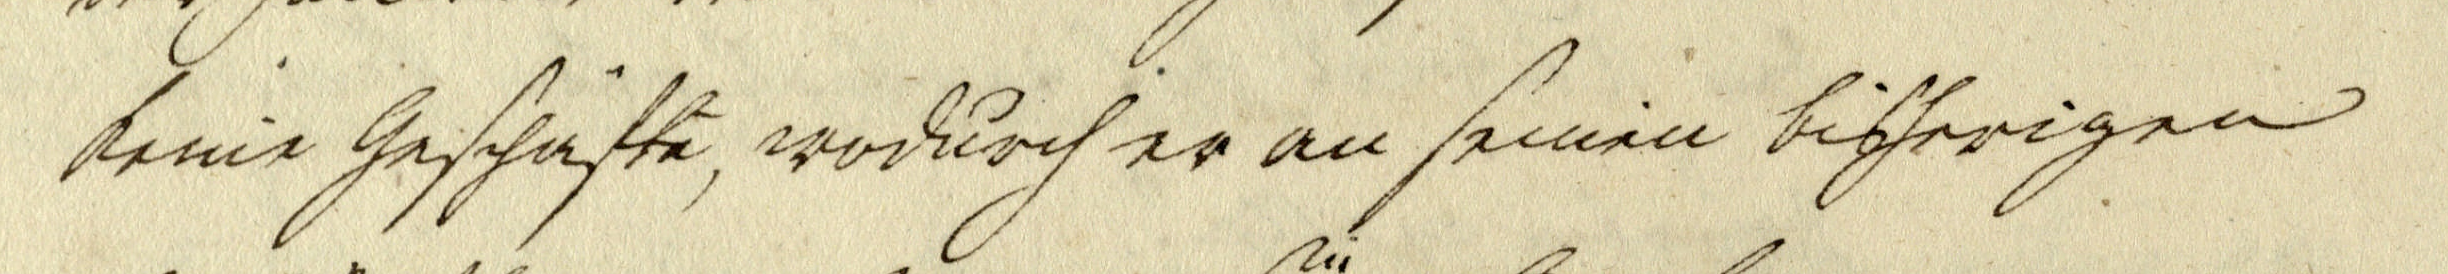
keine Geschäfte, wodurch er an seinen bisherigen
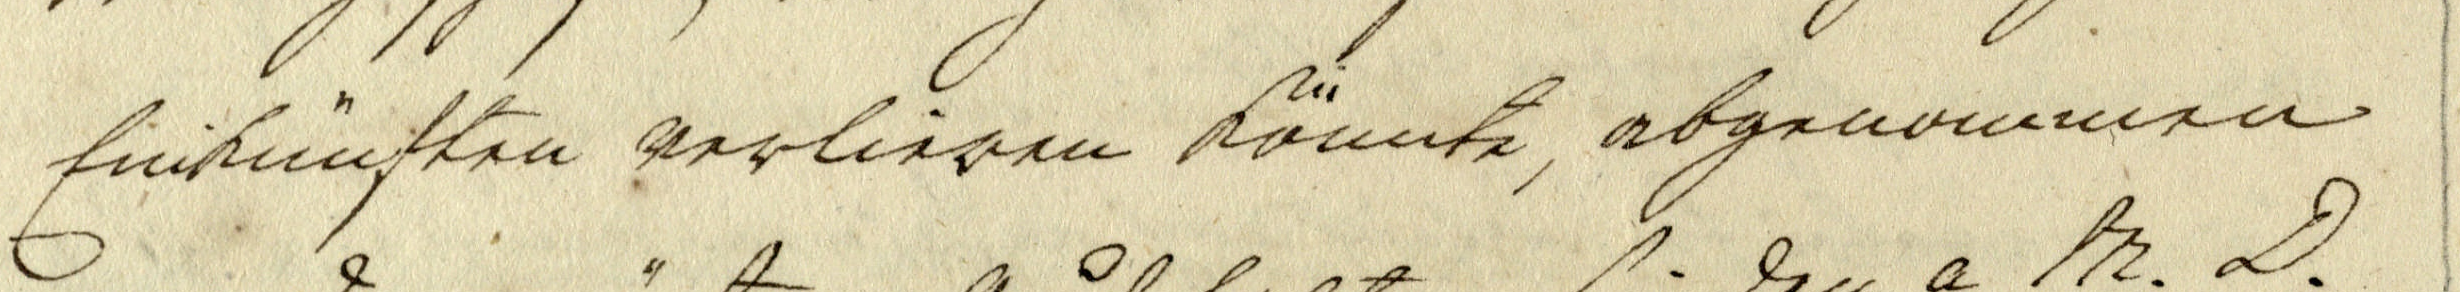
Einkünften verlieren könnte, abgenommen
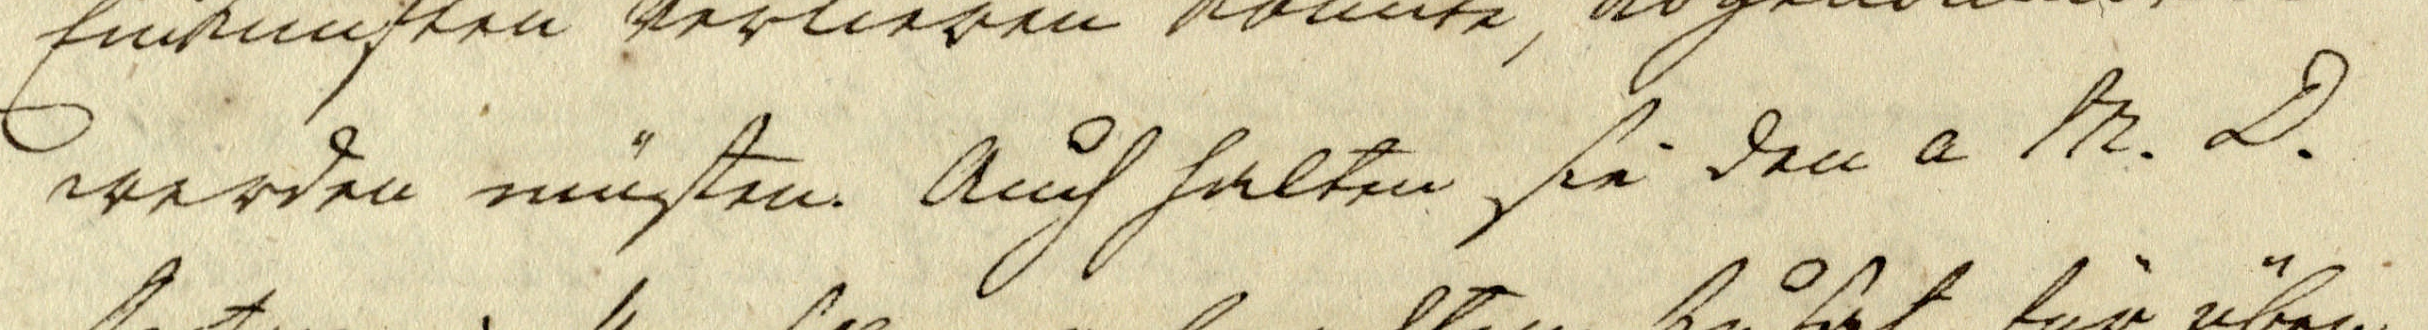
werden müßten. Auch halten sie den a M. D.
